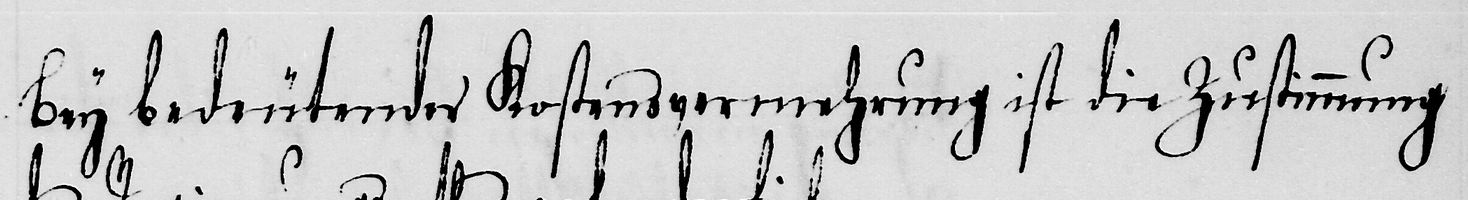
Bey bedeutender Kostenvermehrung ist die Zustimmung
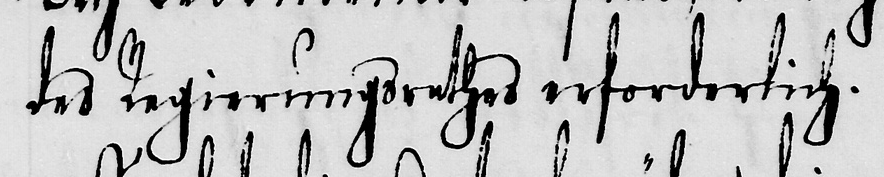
des Regierungsrathes erforderlich.
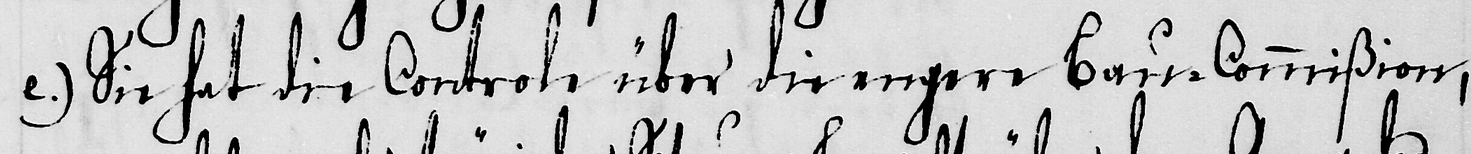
e.) Sie hat die Controlle über die engere Bau-Commißion,
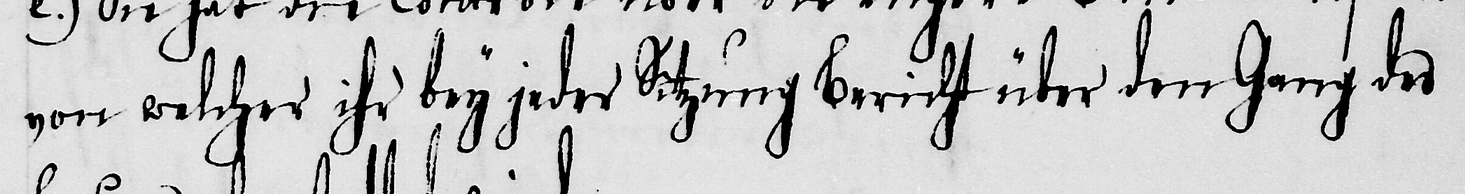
von welcher ihr bey jeder Sitzung Bericht über den Gang des
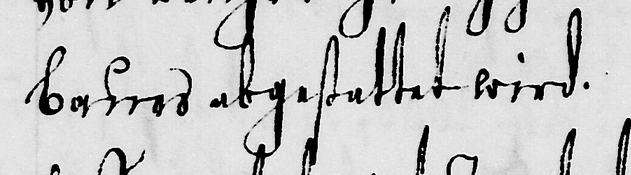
Baues abgestattet wird.
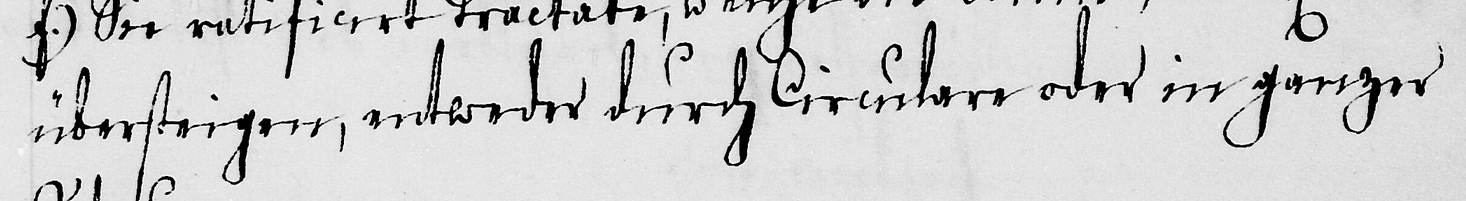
übersteigen, entweder durch Circulare oder in ganzer
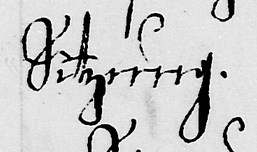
Sitzung.
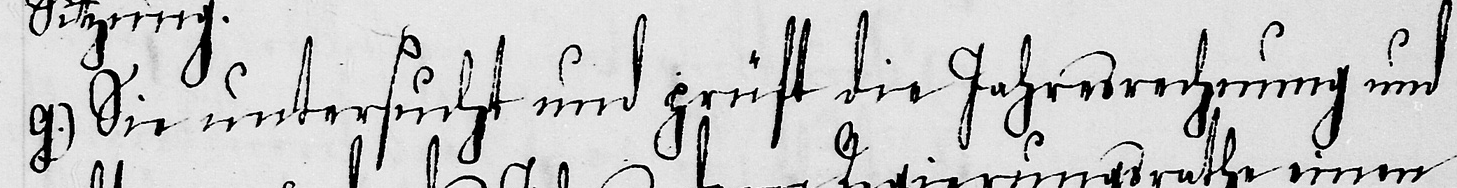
g.) Sie untersucht und prüft die Jahresrechnung und
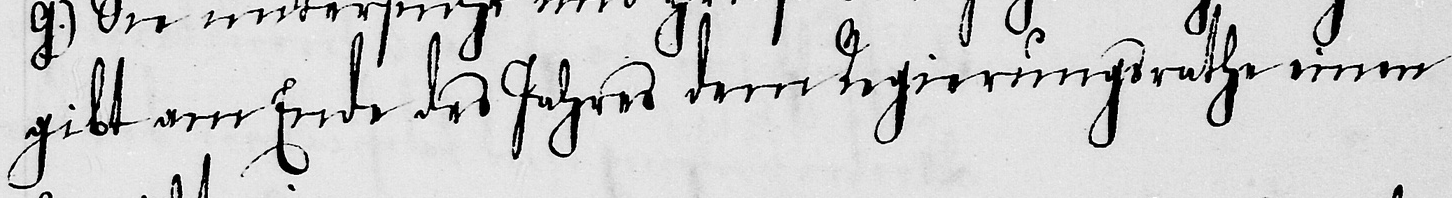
gibt am Ende des Jahres dem Regierungsrathe einen
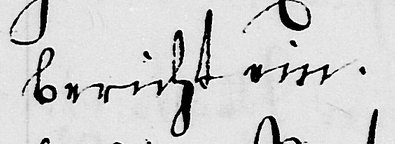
Bericht ein.
